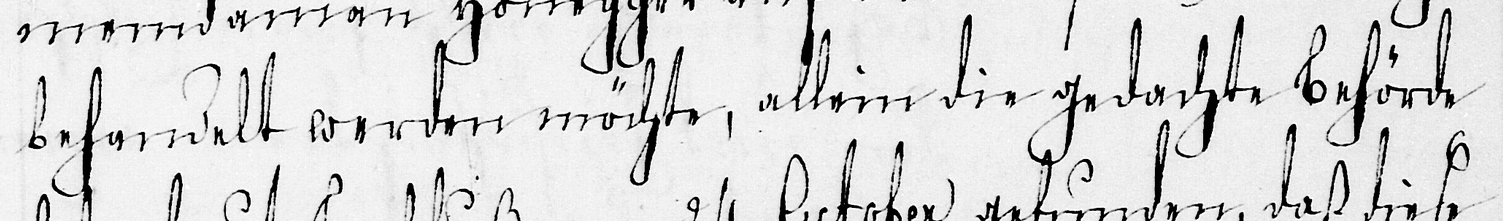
behandelt werden möchte, allein die gedachte Behörde
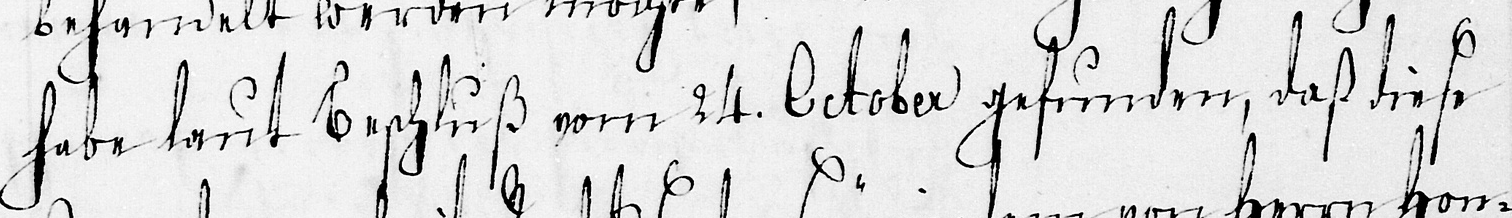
habe laut Beschluß vom 24. October gefunden, daß diese
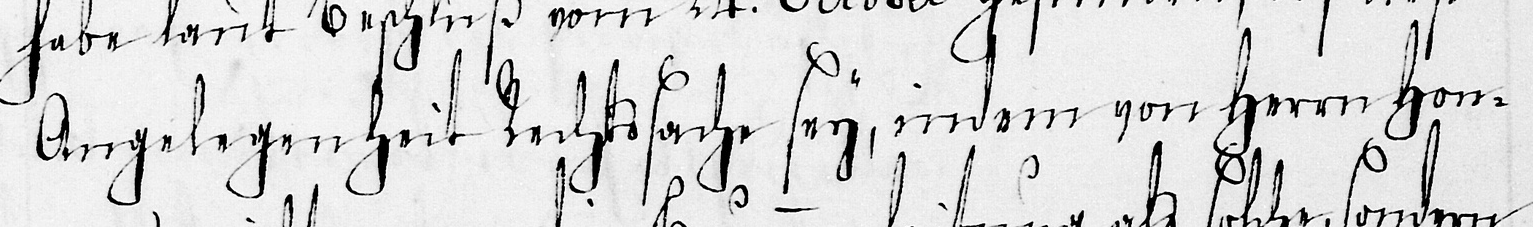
Angelegenheit Rechtssache sey, indem von Herrn Hon¬
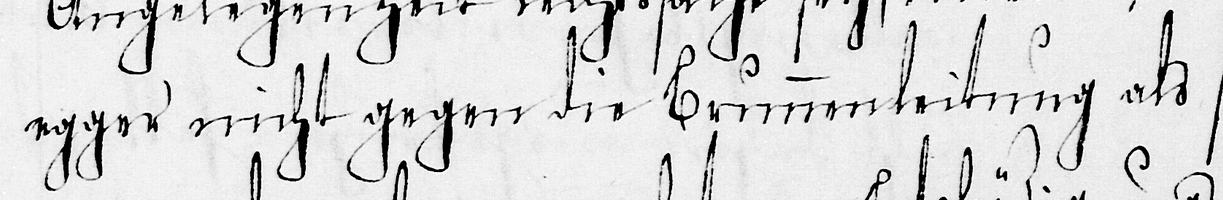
egger nicht gegen die Brunnenleitung als
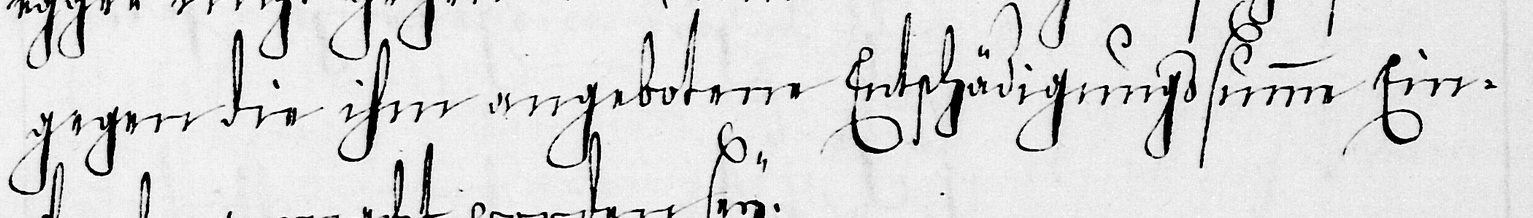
gegen die ihm angebotene Entschädigungssumme Ein¬
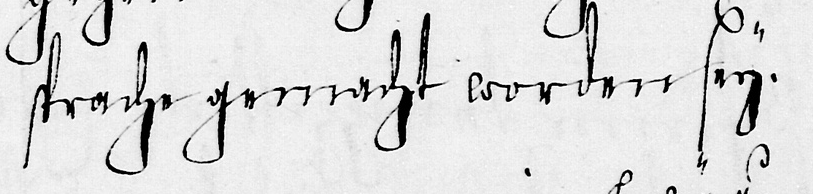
sprache gemacht worden sey.
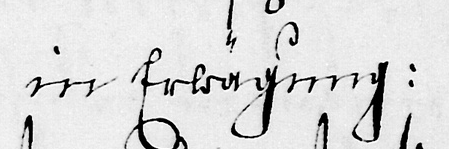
in Erwägung:
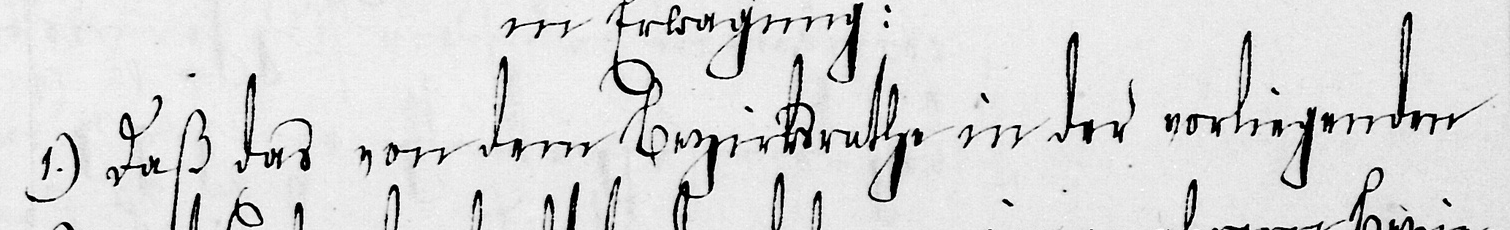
1.) Daß das von dem Bezirksrathe in der vorliegenden
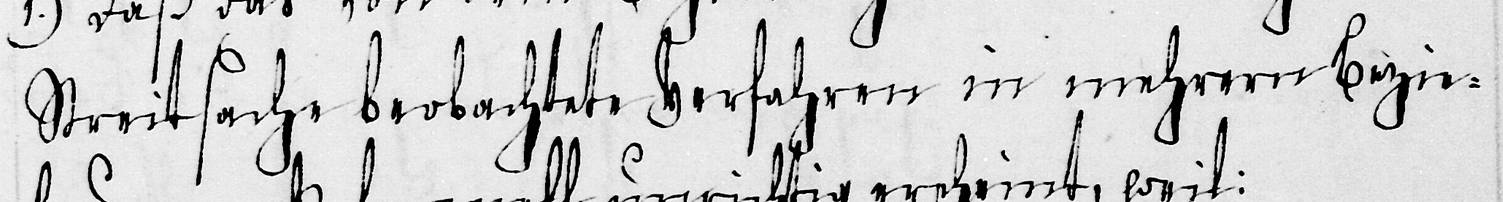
Streitsache beobachtete Verfahren in mehrern Bezie¬
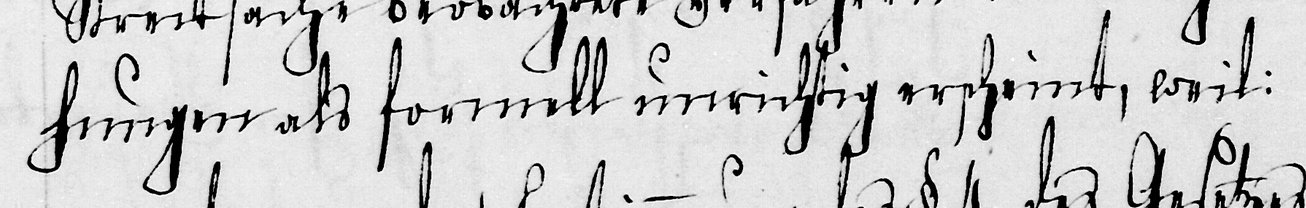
hungen als formell unrichtig erscheint, weil:
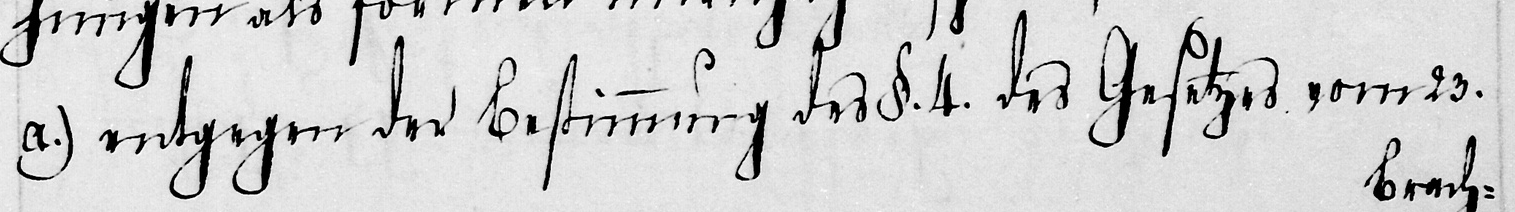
a.) entgegen der Bestimmung des §. 4. des Gesetzes vom 23.
